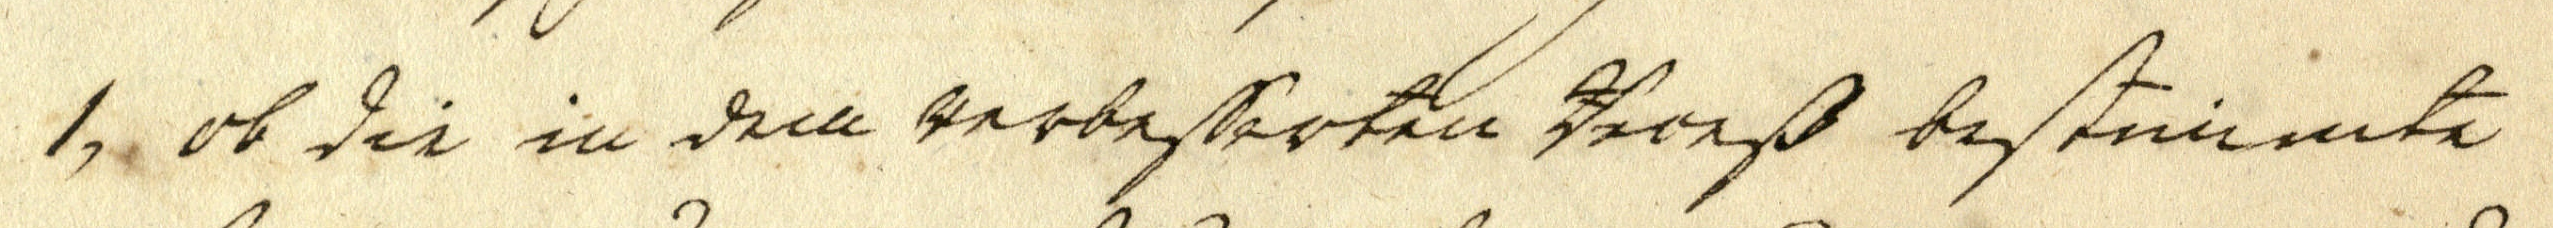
1 , ob die in dem verbesserten Receß bestimmte
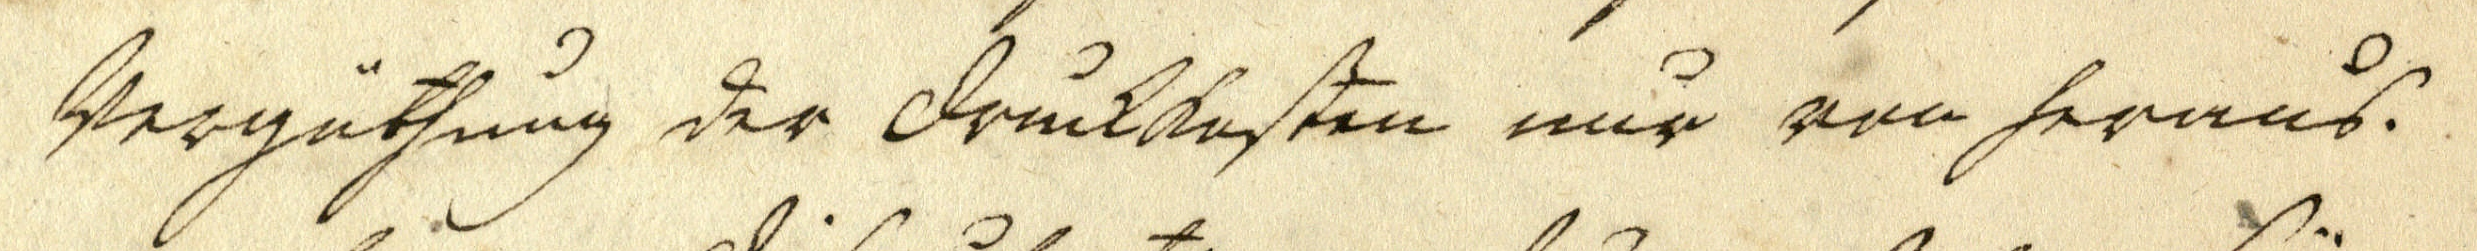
Vergüthung der Druckkosten nur von heraus¬
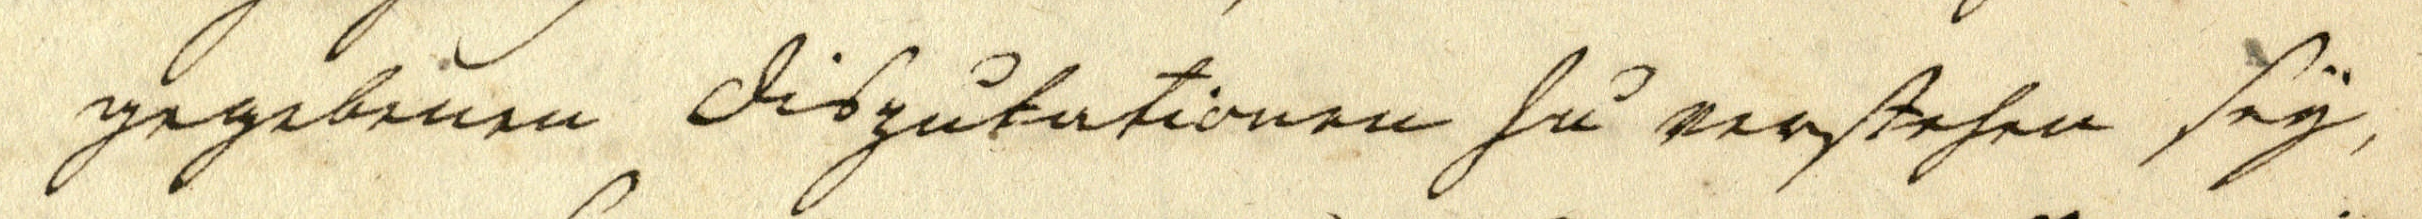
gegeben Disputationen zu verstehen seÿ,
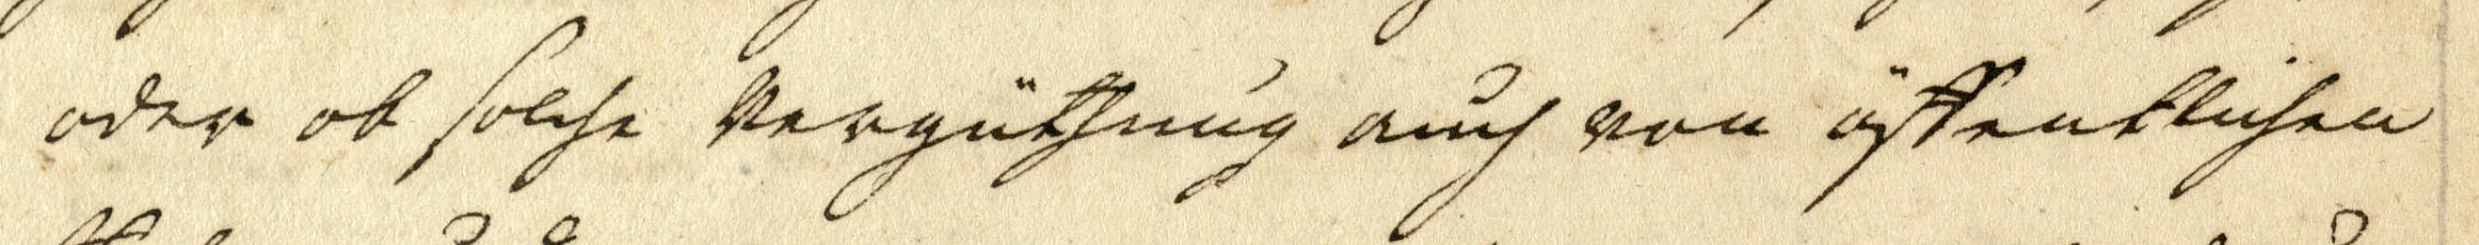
oder ob solche Vergüthung auch von öffentlichen
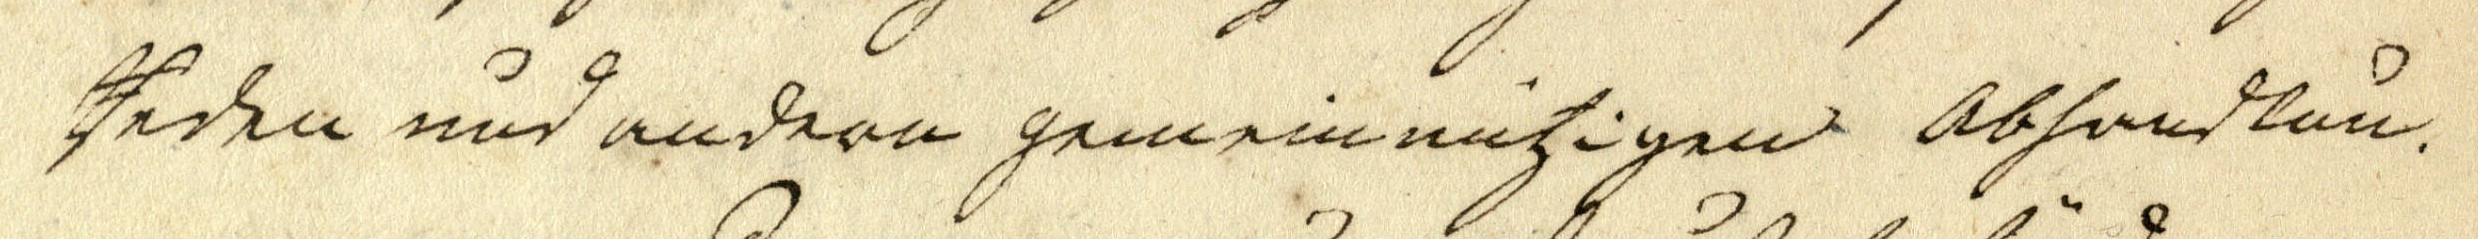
Reden und andern gemeinnützigen Abhandlun¬
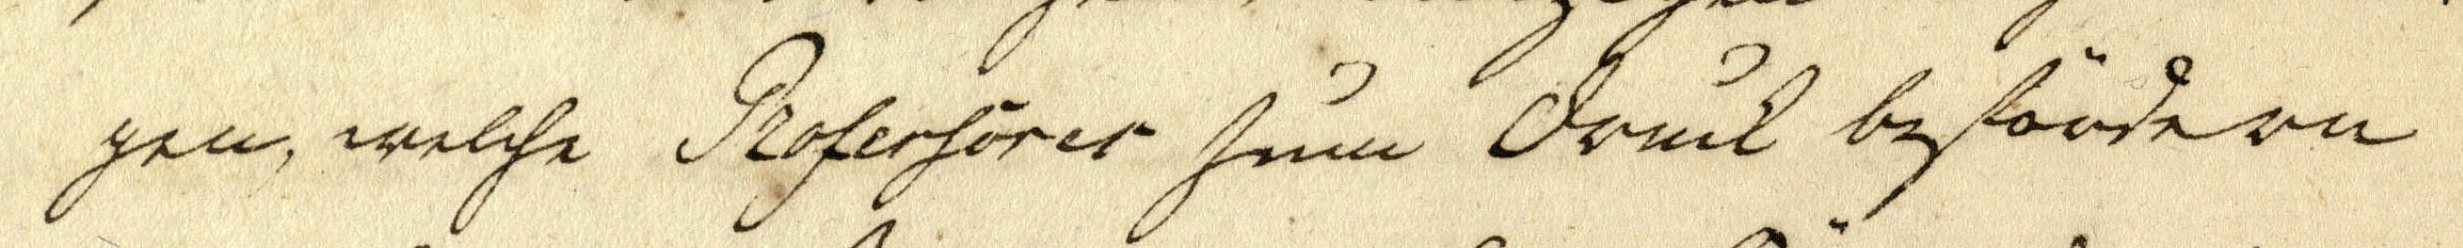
gen, welche Professores zum Druck befördern
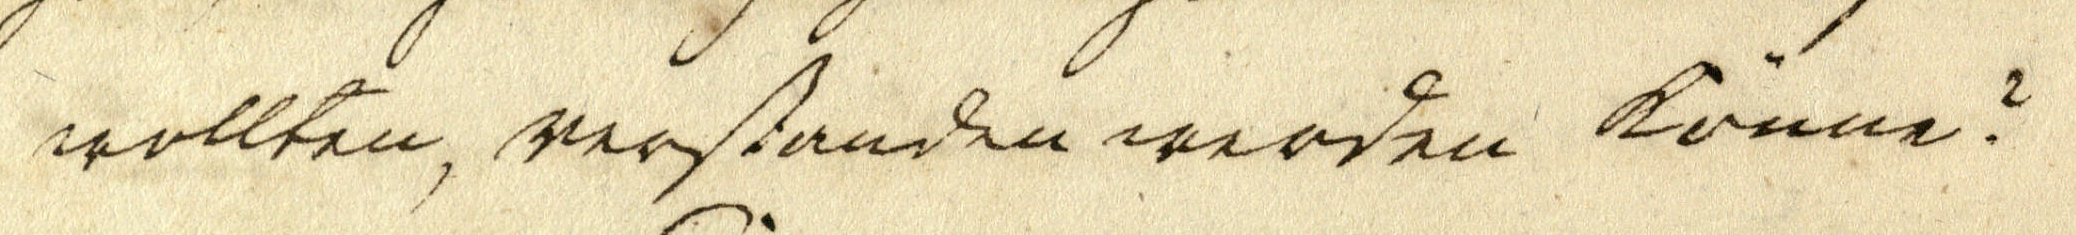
wollten, verstanden werden könne?
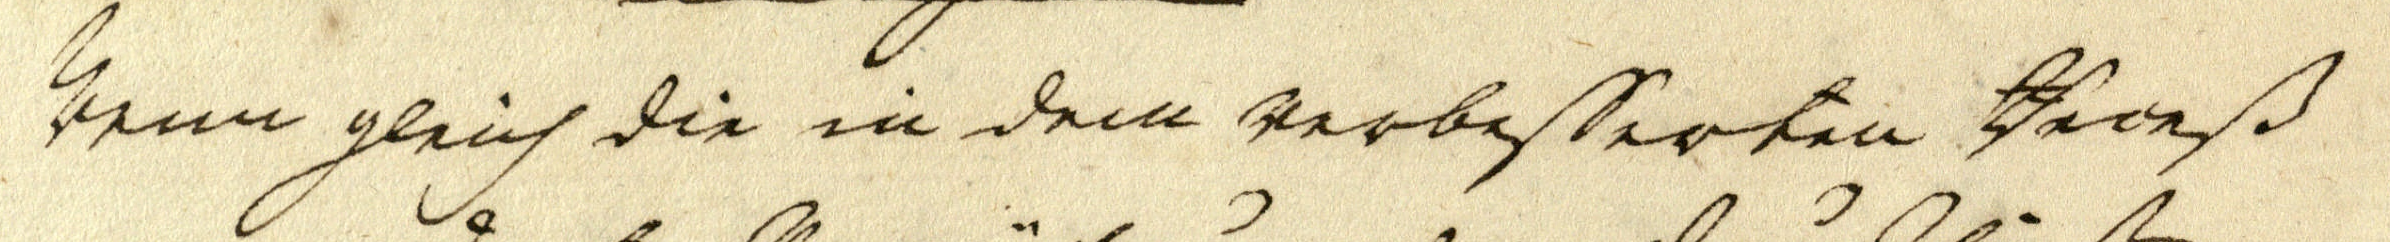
Wenn gleich die in dem verbesserten Receß
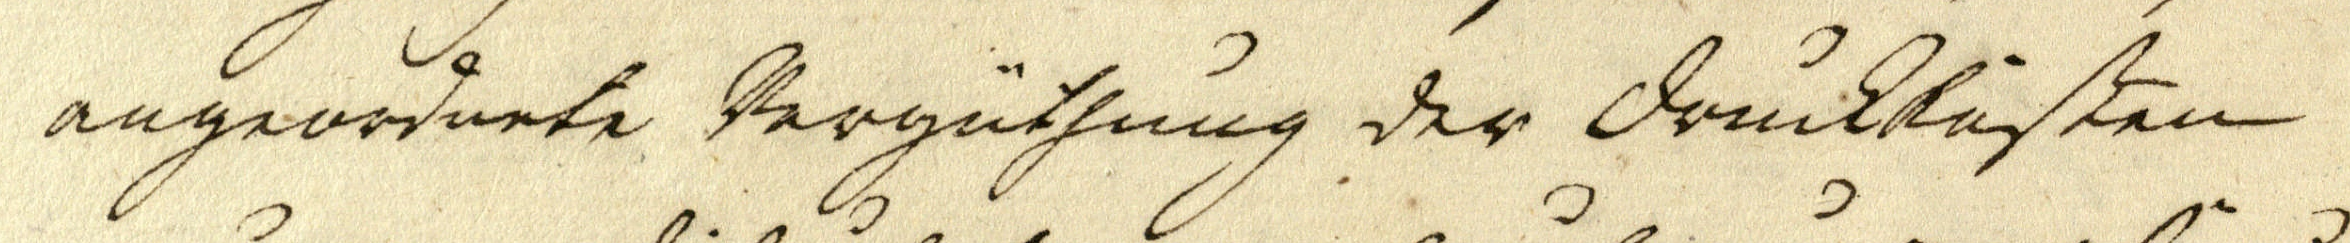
angeordnete Vergüthung der Druckkosten
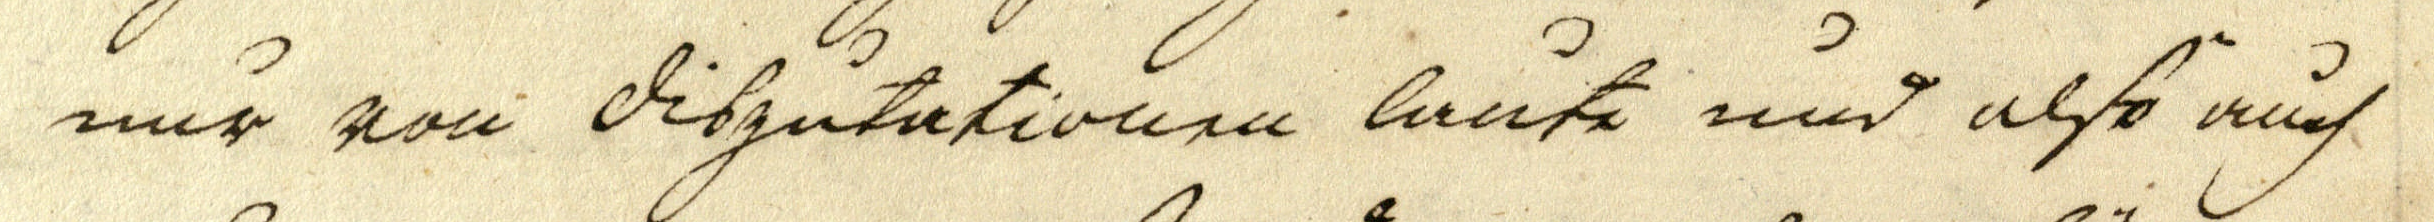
nur von Disputationen laute und also auch
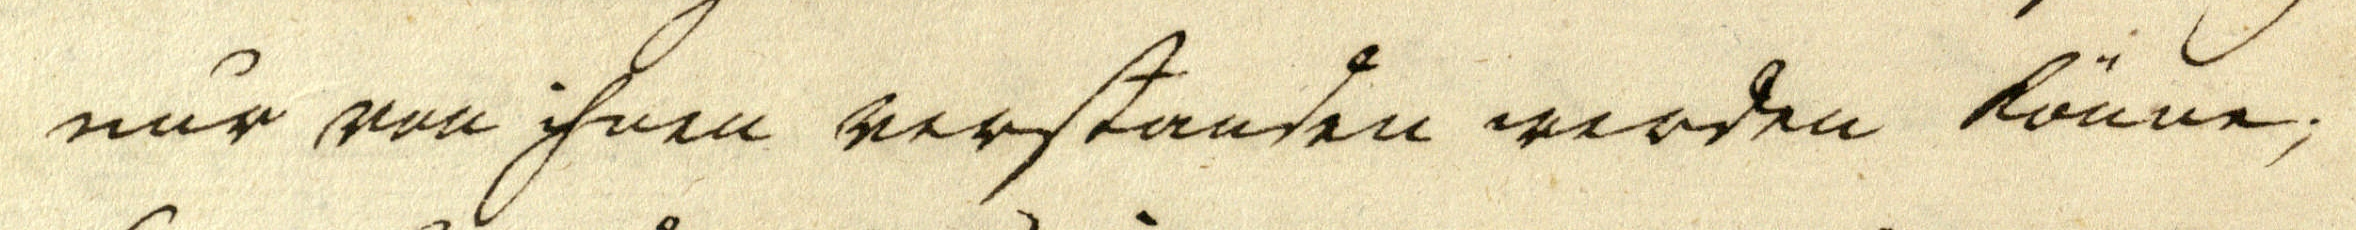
nur von ihnen verstanden werden könne,
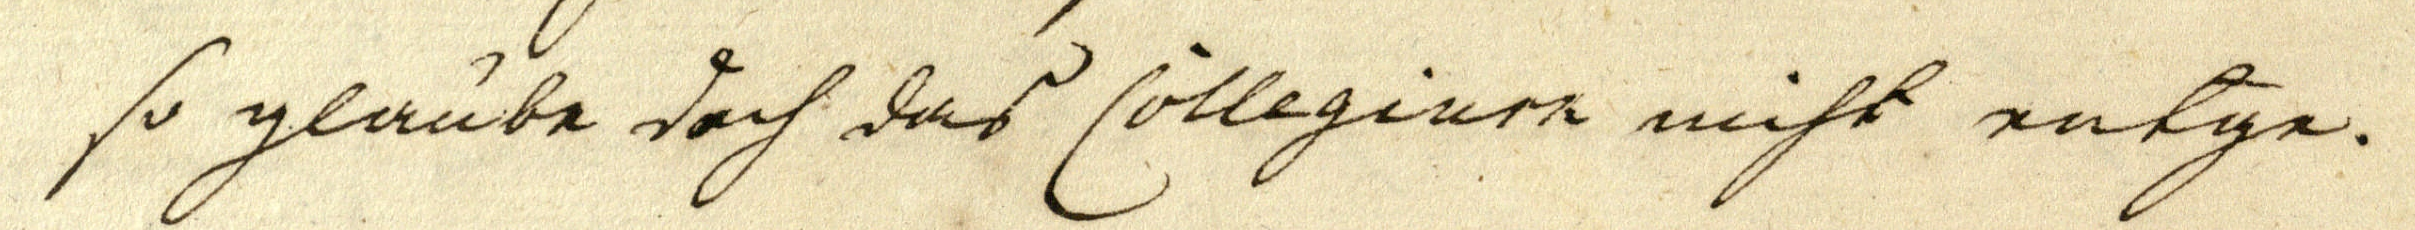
so glaube doch das Collegium nicht entge¬
